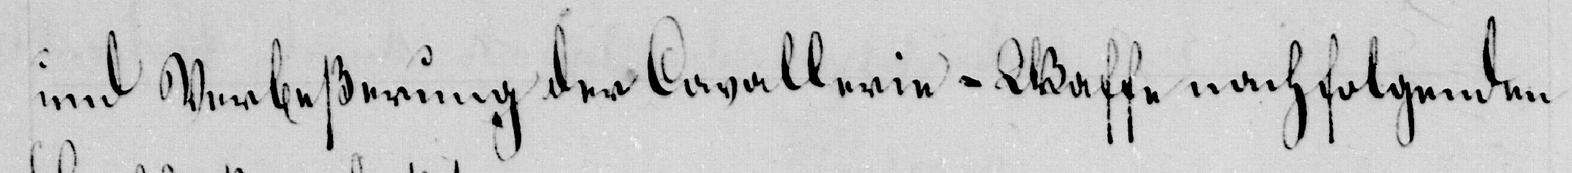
und Verbeßerung der Cavallerie-Waffe nachfolgenden
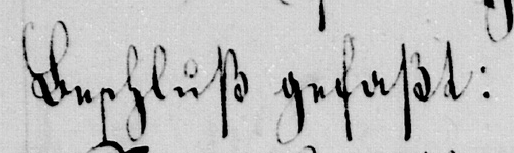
Beschluß gefaßt:
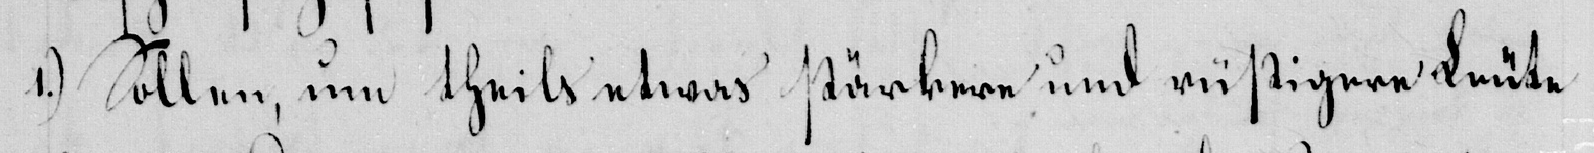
1.) Sollen, um theils etwas stärkere und rüstigere Leute
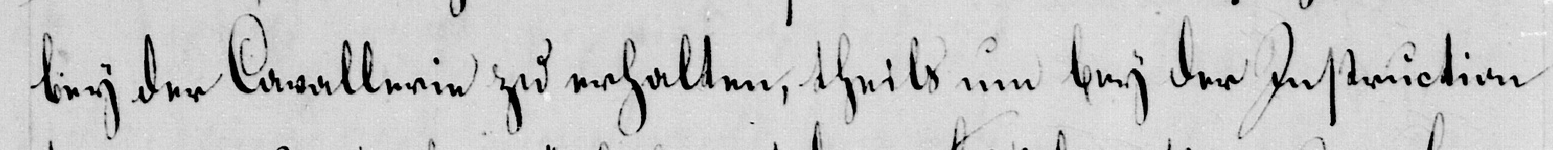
bey der Cavallerie zu erhalten, theils um bey der Instruction
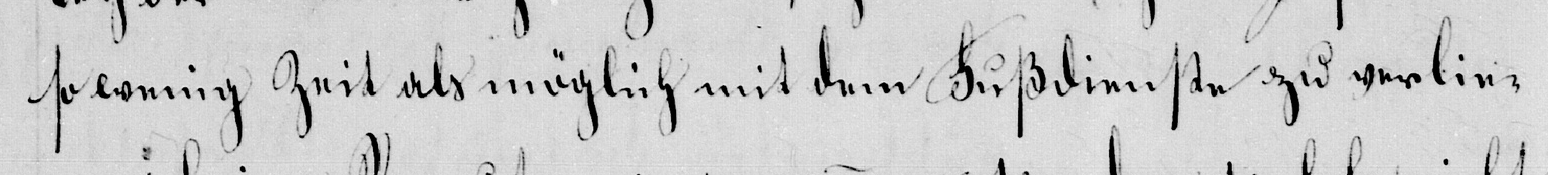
so wenig Zeit als möglich mit dem Fußdienste zu verlie¬
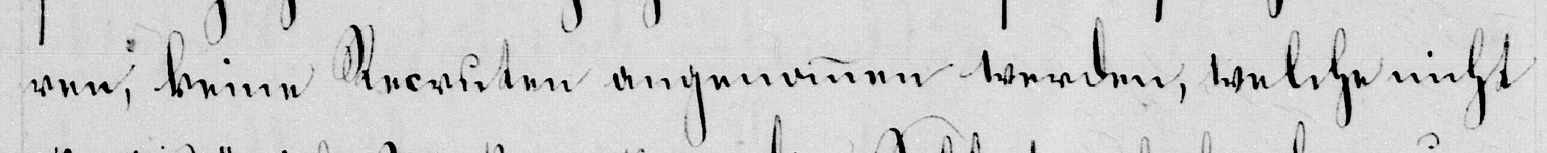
ren, keine Recruten angenommen werden, welche nicht
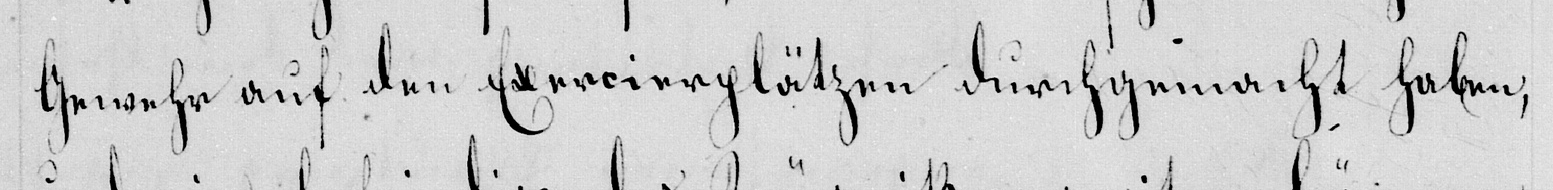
Gewehr auf den Exercierplätzen durchgemacht haben,
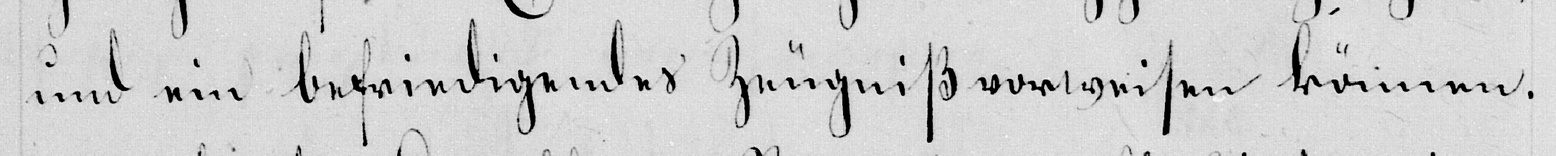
und ein befriedigendes Zeugniß vorweisen können.
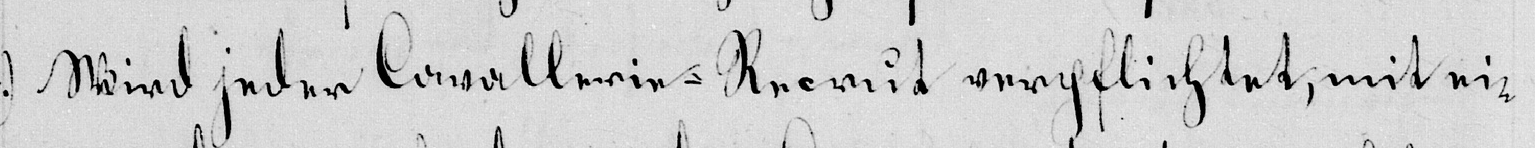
Wird jeder Cavallerie-Recrut verpflichtet, mit ei¬
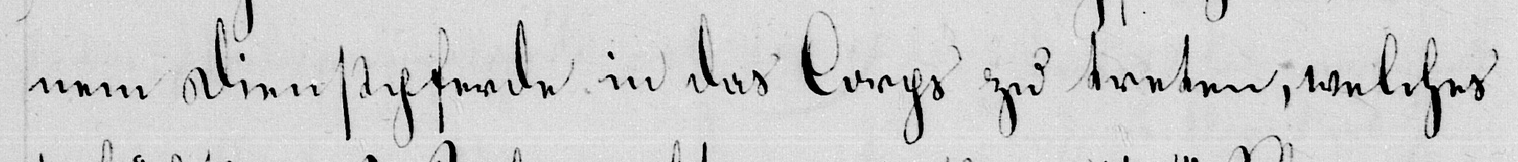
nem Dienstpferde in das Corps zu treten, welches
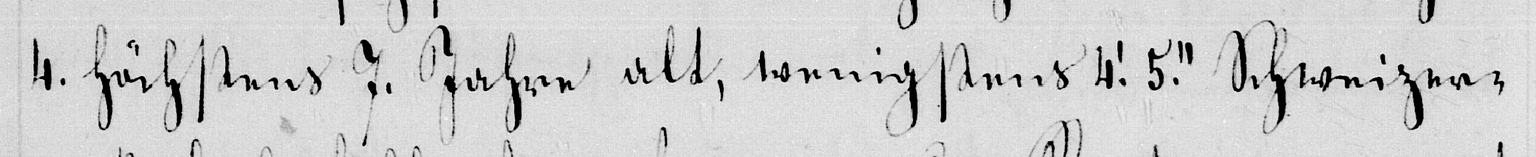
4. höchstens 7. Jahre alt, wenigstens 4.‘ 5.‘‘ Schweizer¬
